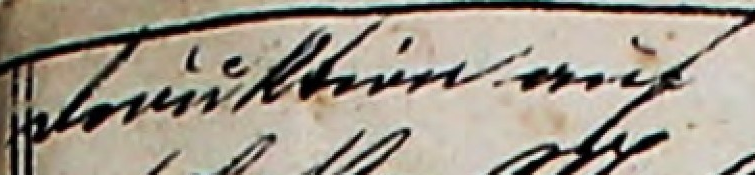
Reduktion auf
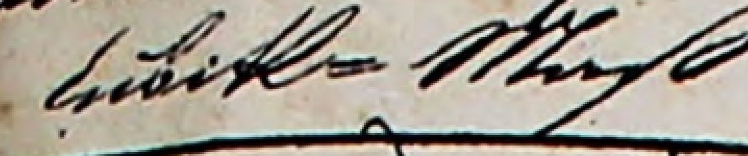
Cubik= Maß
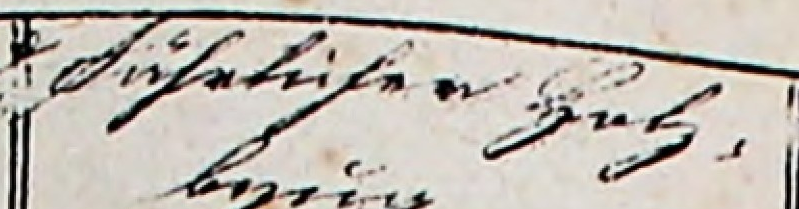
Jährlicher Holz„
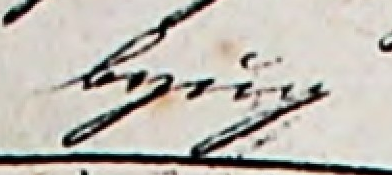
bezug
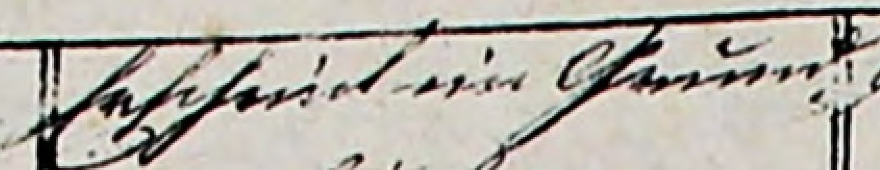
Erscheint im Grund„
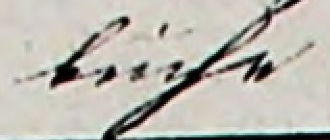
buche
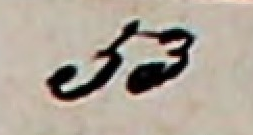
53
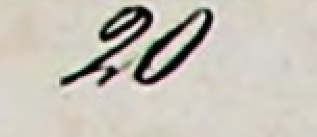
20
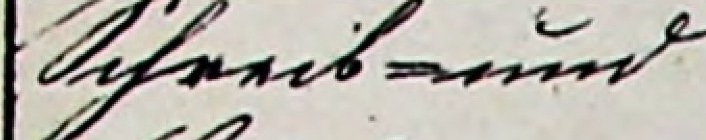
Schreib = und
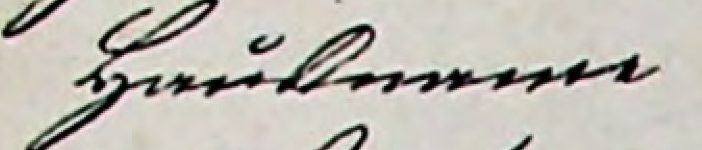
Hausmann
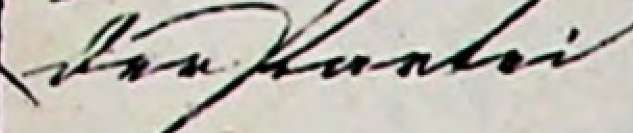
der Partei
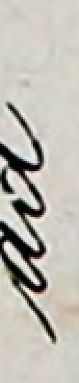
ad
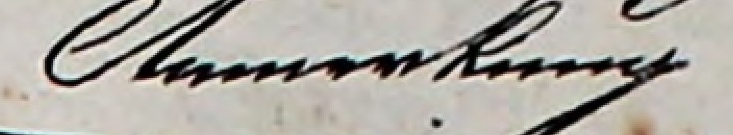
Anmerkung
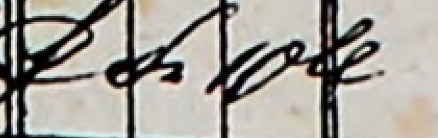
???
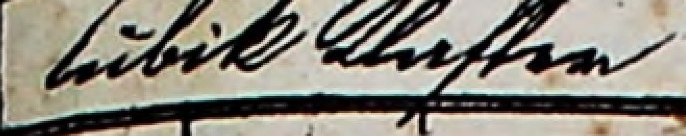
We Klafter
